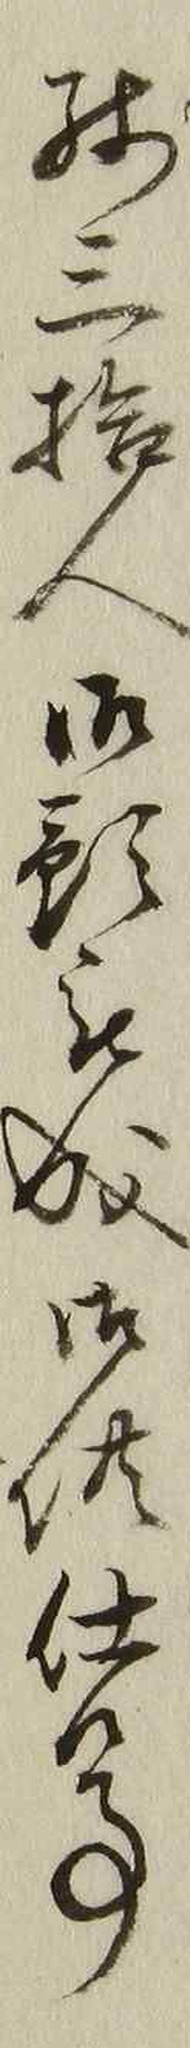残三拾人御預被成御供仕候事
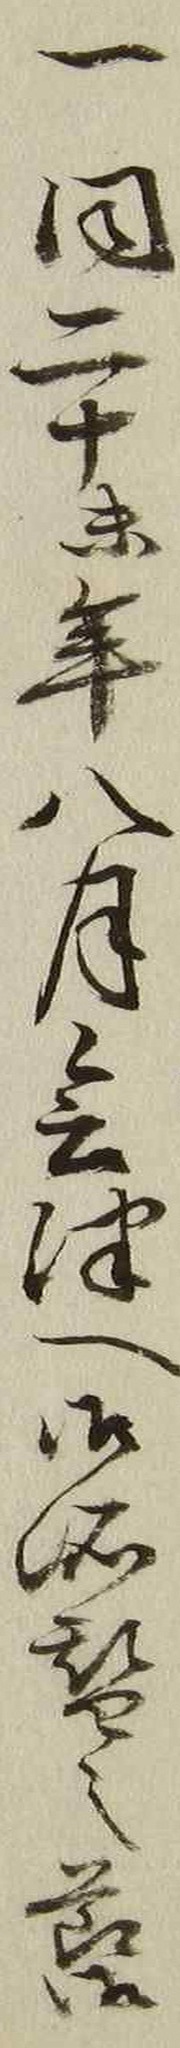一同二十未年八月会津へ御所替之節御
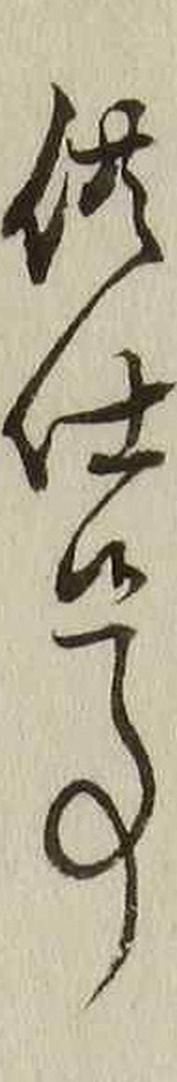供仕候事
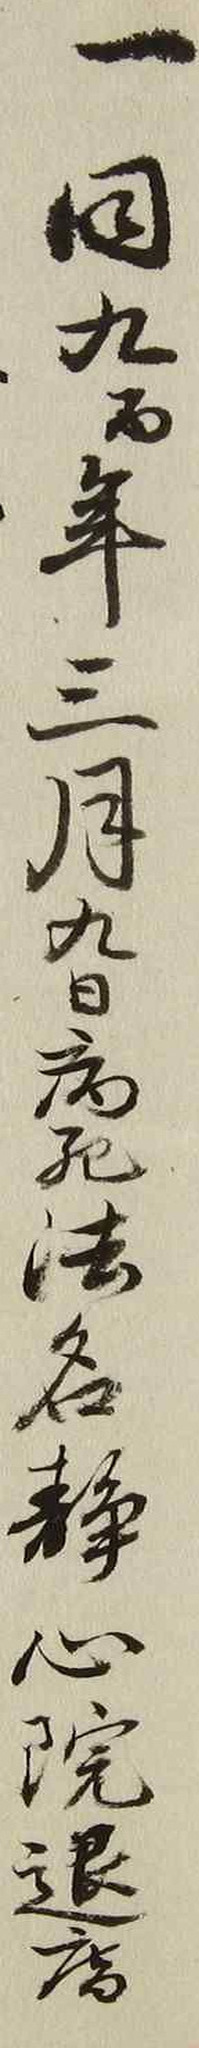一同九酉年三月九日病死法名静心院退庵
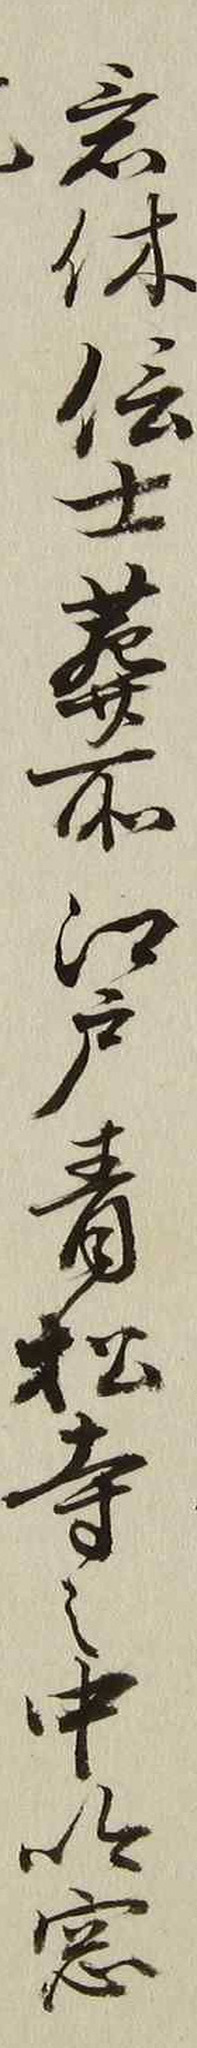意休信士葬所江戸青松寺之中吟窓
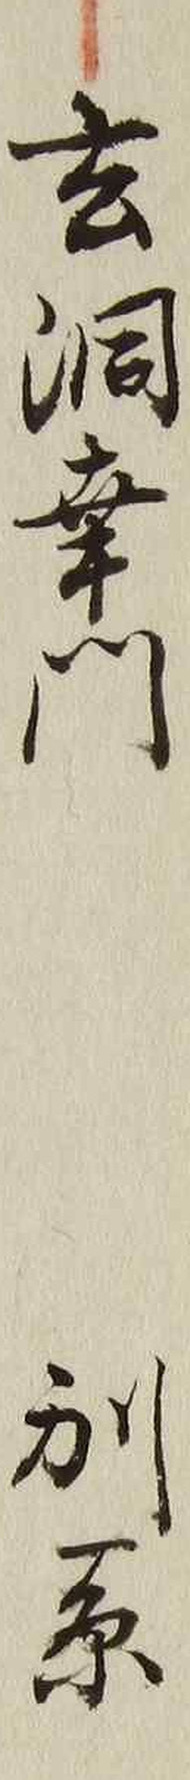玄洞幸門別系
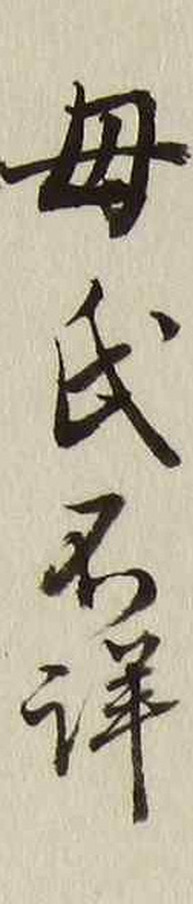母氏不詳
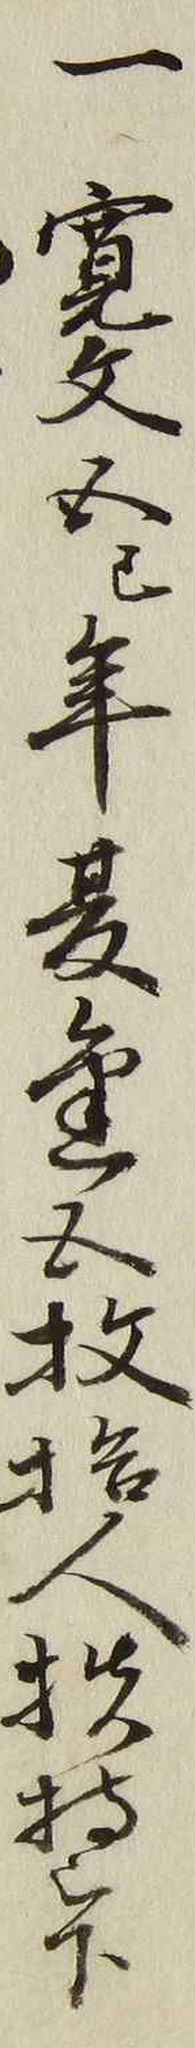一寛文五巳年夏金五枚拾人扶持被下
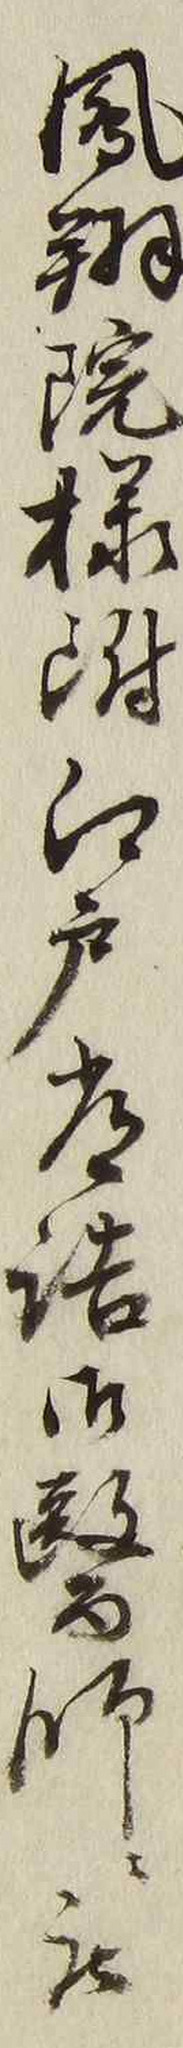鳳翔院様附江戸常詰御医師ニ被

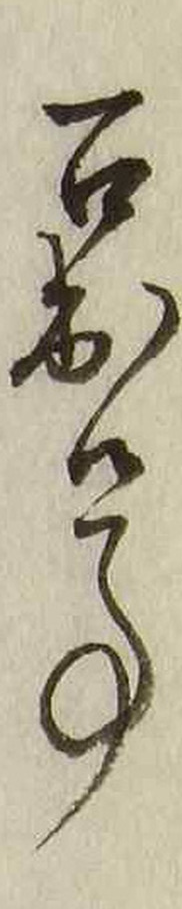召出候事
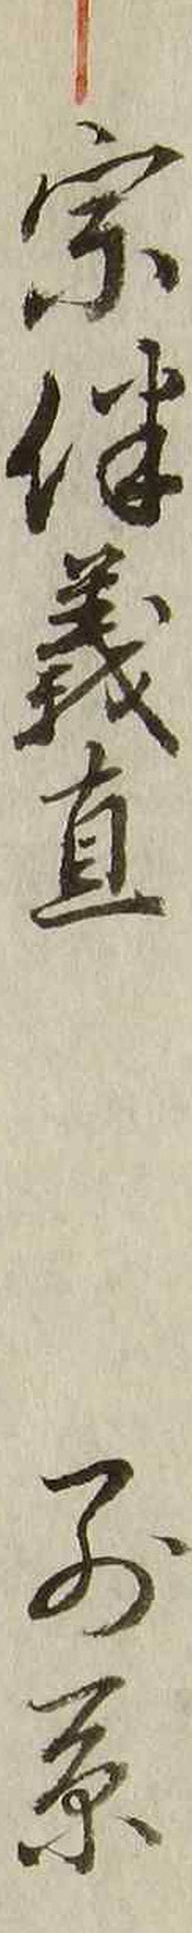宗伴義直別系
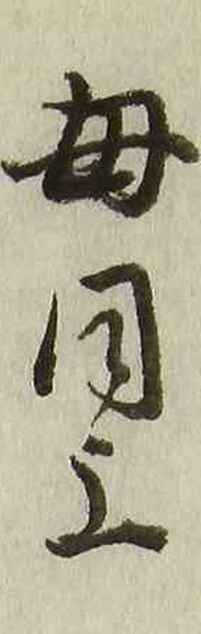母同上
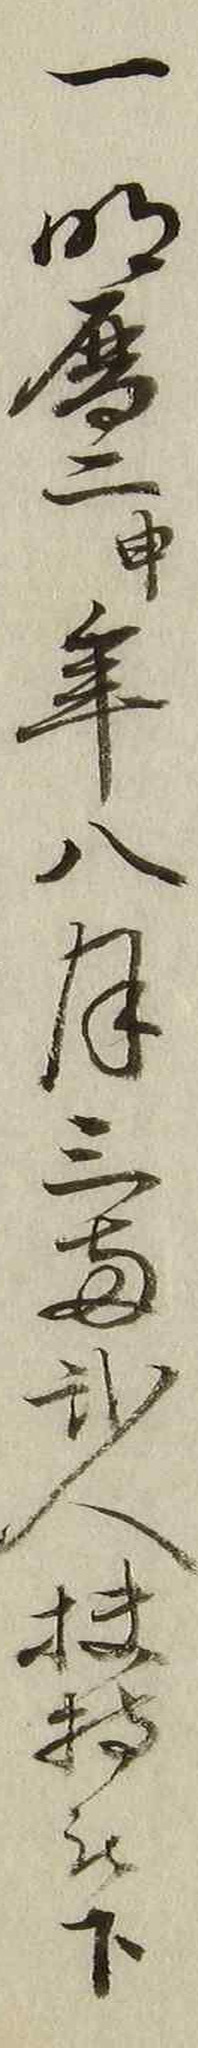一明暦二申年八月三両弐人扶持被下
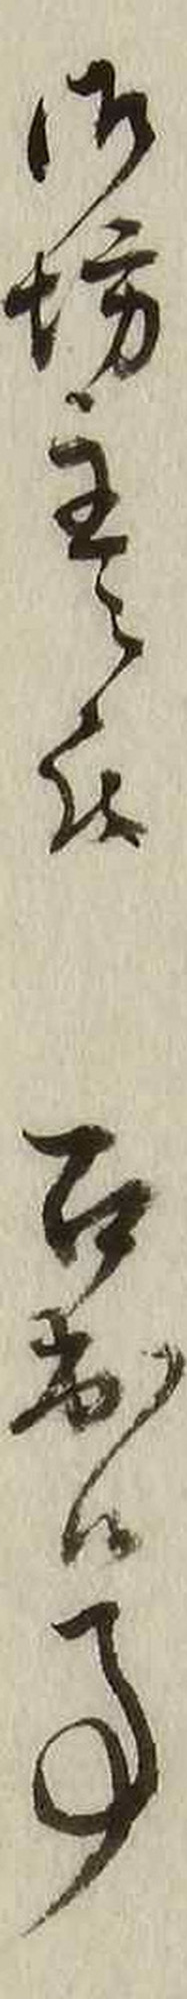御坊主ニ被召出候事
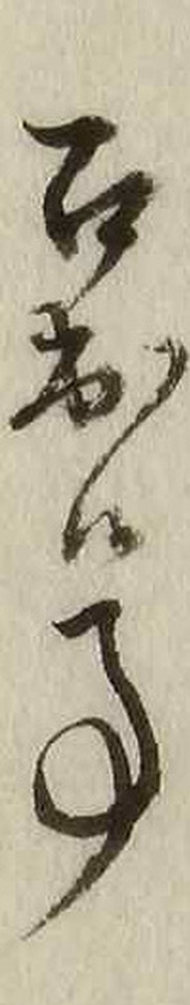召出候事
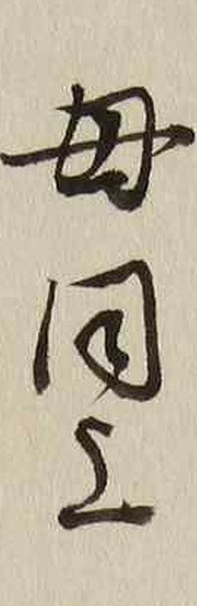母同上
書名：諸士系譜　巻之39　は之部7
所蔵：会津若松市立会津図書館
